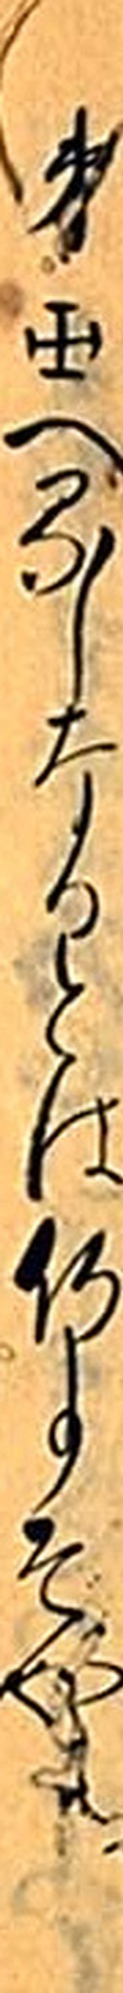弟☩へるしなるとは何事そや
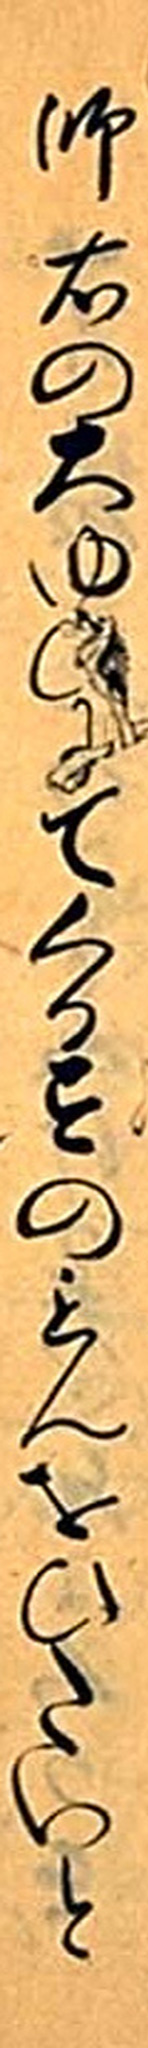師右の大ゆひにてくるすのもんをひたいと
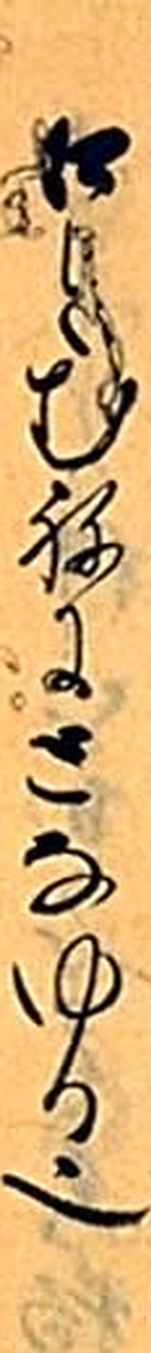口とむねにとなゆる也
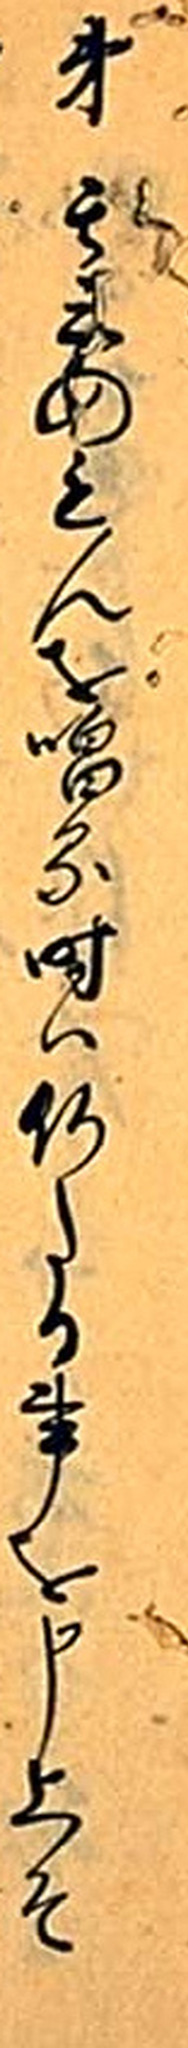弟其のもんを唱る時は何たる事を申上そ
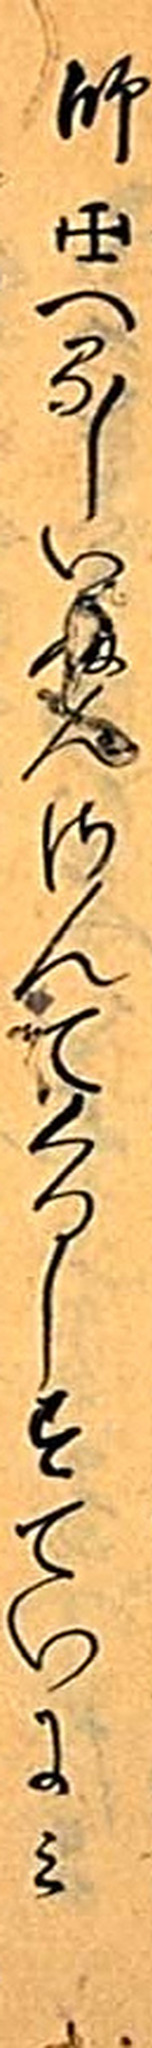師☩へるしいんさんてくるしすていにみ
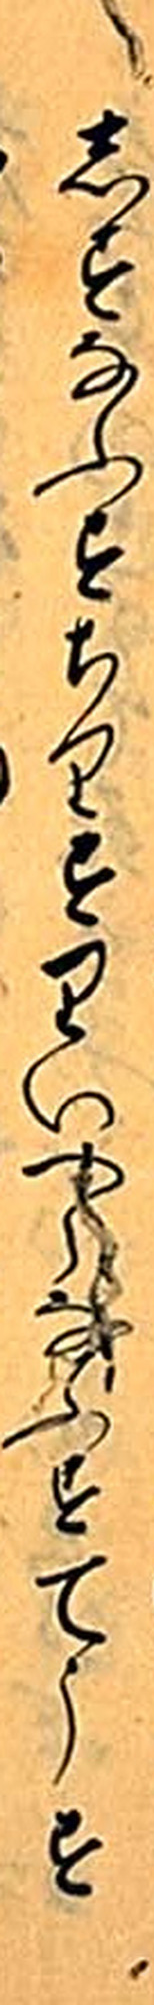しすなふすちりすりいへらなふすてうす
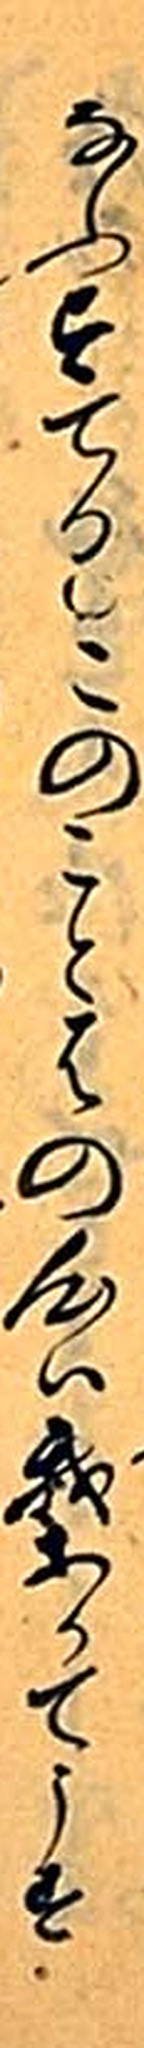なふすてる○このことはの心は我等かてうす
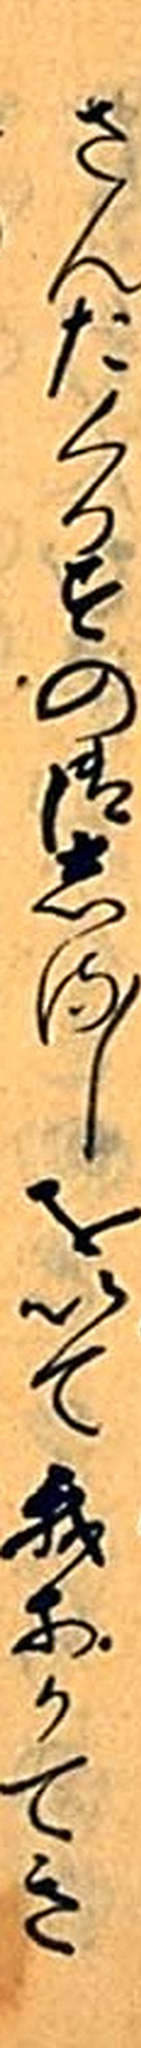さんたくるすの御しるしを以て我等かてき
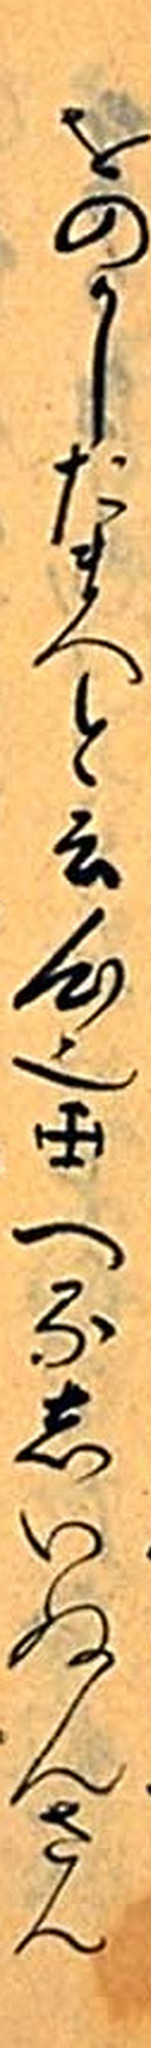をのかしたまへと云心也☩へるしいぬんさん
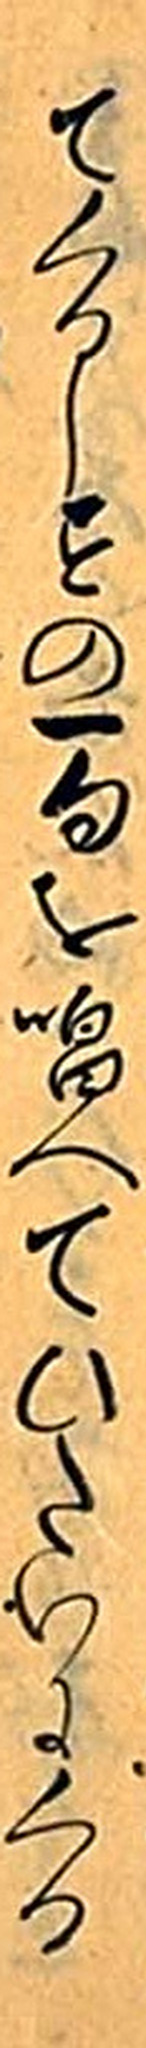てくるしすの一句を唱へてひたいにくる
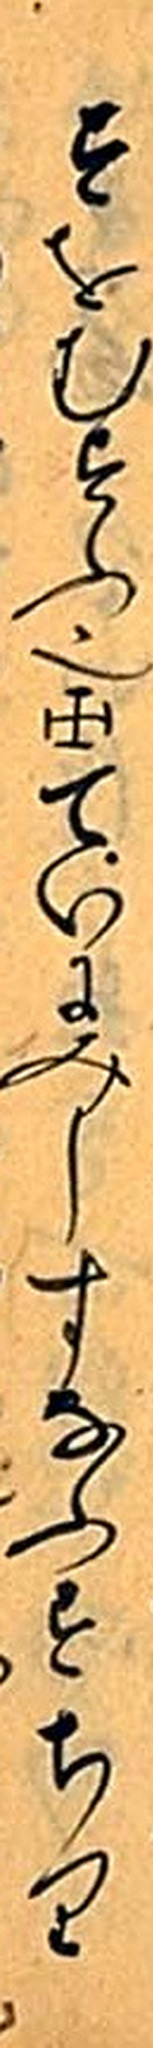すをむすふ也☩ていにみしすなふすちり
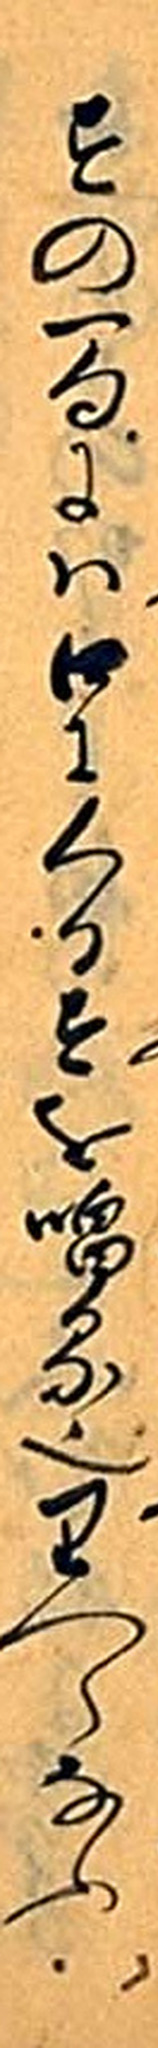すの一句には口にくるすを唱る也りへらなふ
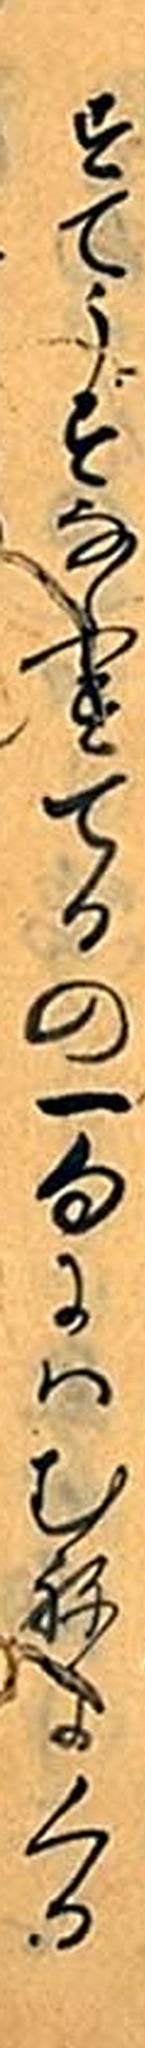すてうすなふすてるの一句にはむねにくる
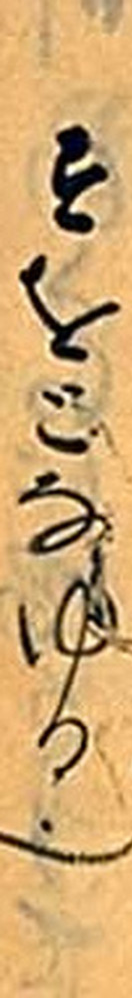すをとなゆる也
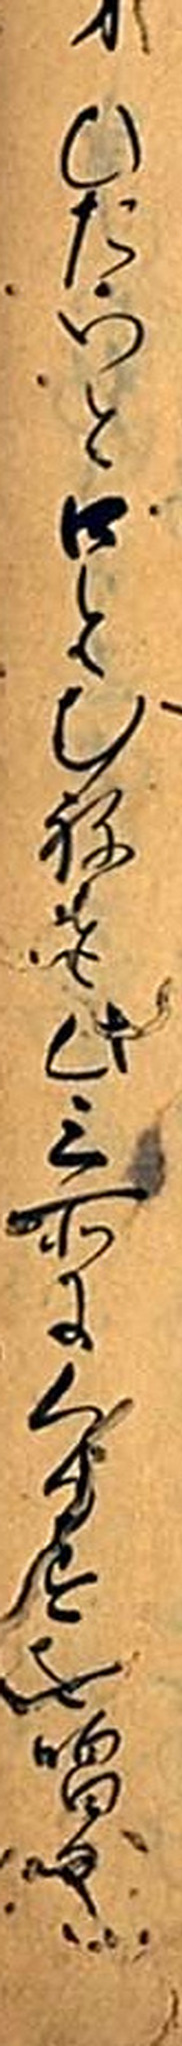弟ひたいと口とむねと此三所にくるすを唱る

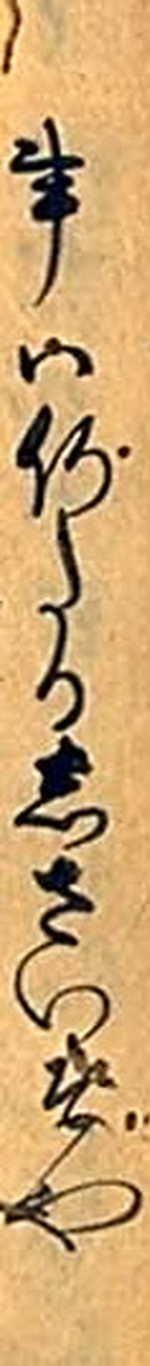事は何たるしさいそや
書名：ドチリナ・キリシタン
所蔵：東京大学総合図書館 / General Library in the University of Tokyo
